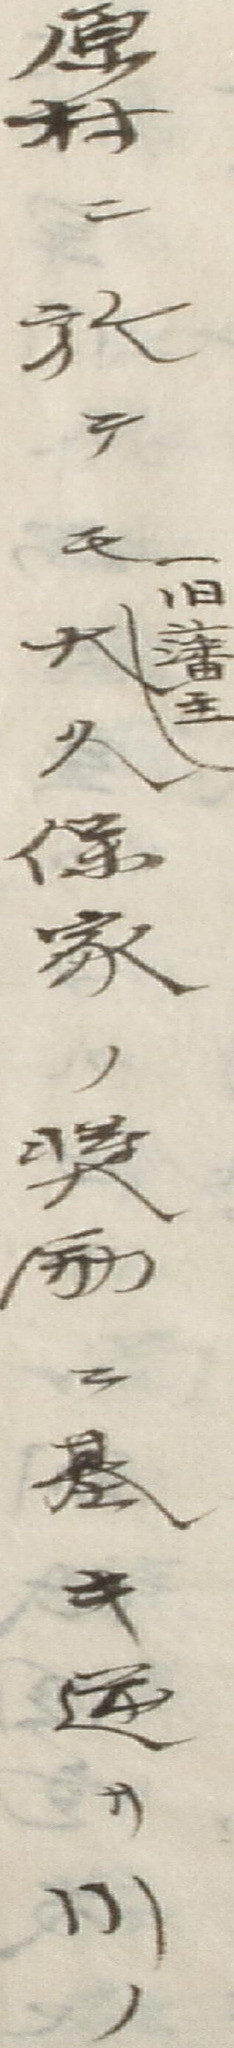原村ニ於テモ大久保家ノ奨励ニ基キ逆サ川ノ
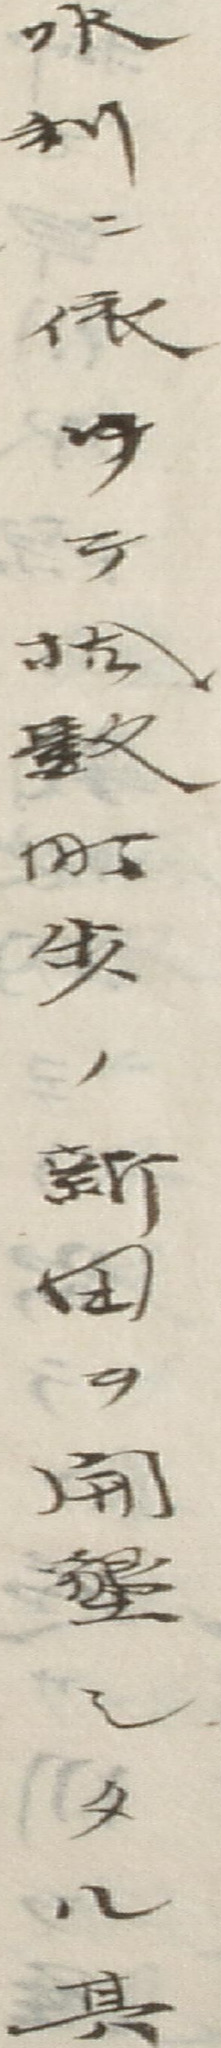水利ニ依リテ拾数町歩ノ新田ヲ開墾シタル其
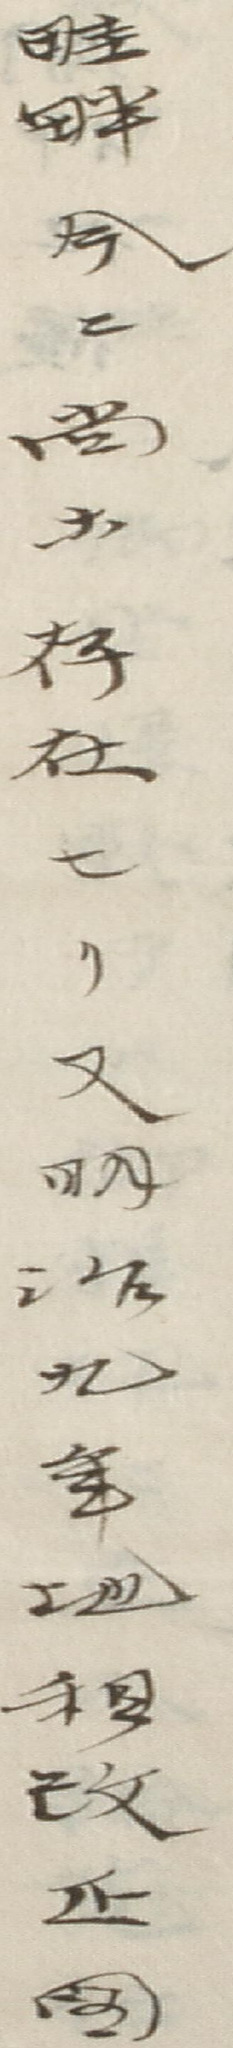畦畔今ニ尚ホ存在セリ又明治九年地租改正図
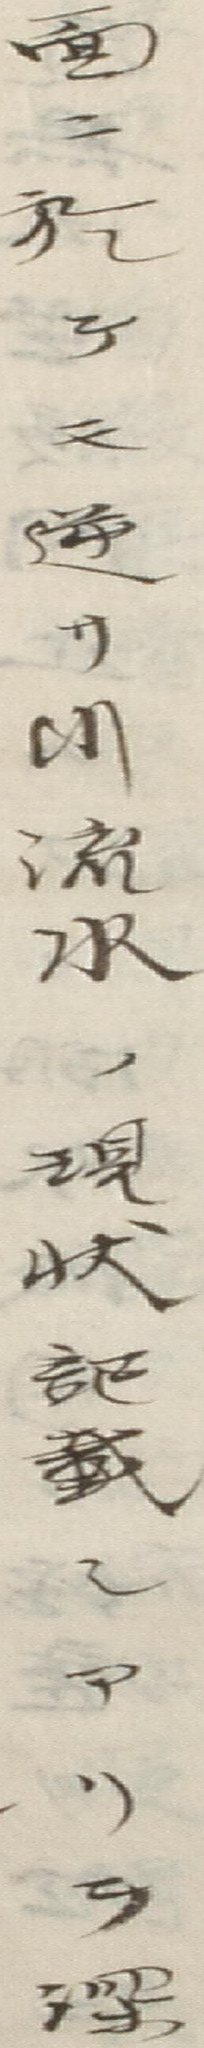面ニ於テモ逆サ川流水ノ現状記載シアリヲ深
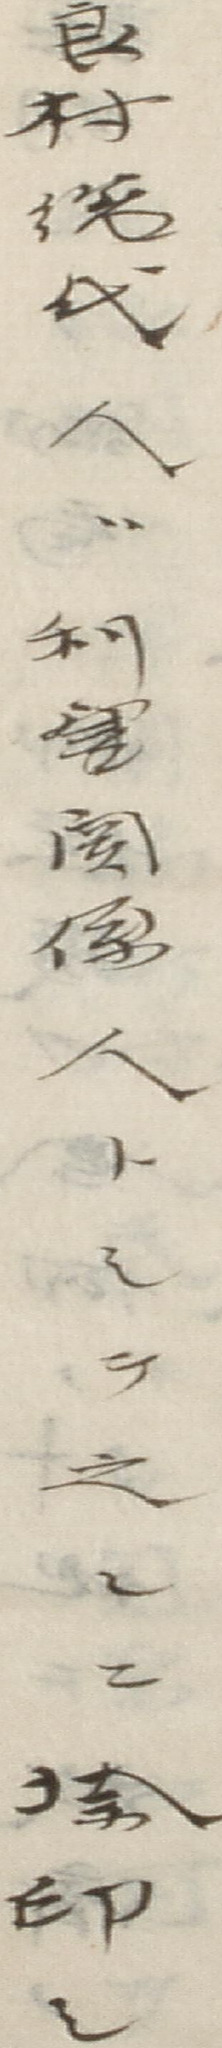良村総代人ハ利害関係人トシテ之レニ捺印シ
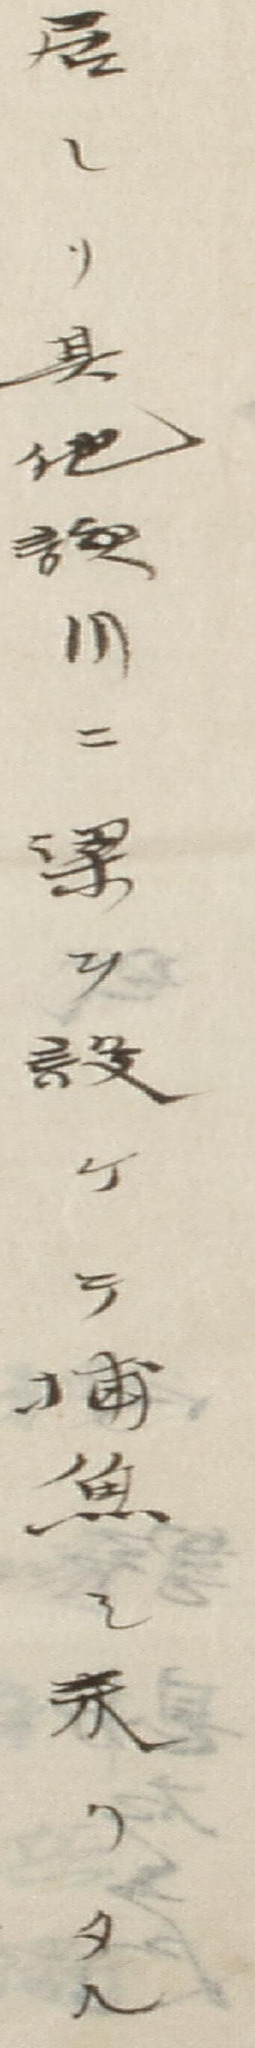居レリ其他該川ニ梁ヲ設ケテ捕魚シ来リタル
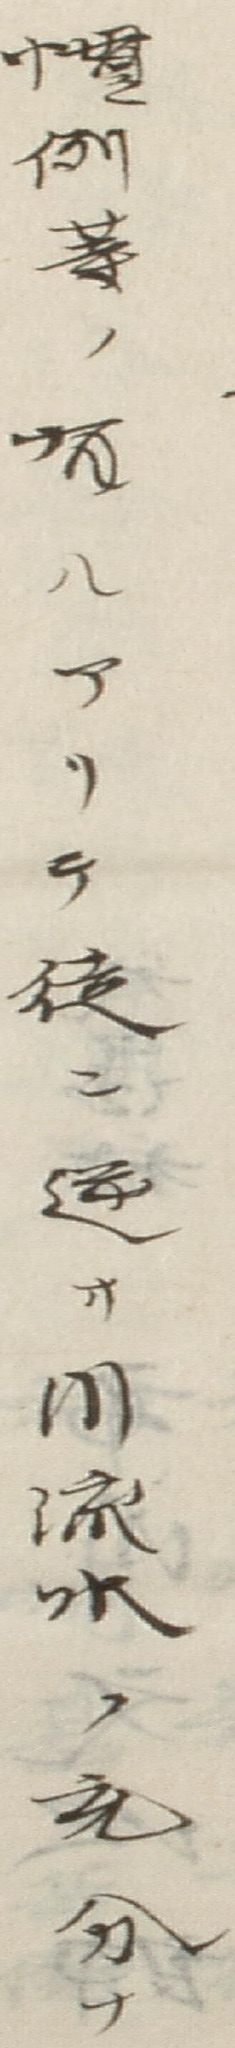慣例等ノ有ルアリテ徒ニ逆サ川流水ノ充分ナ
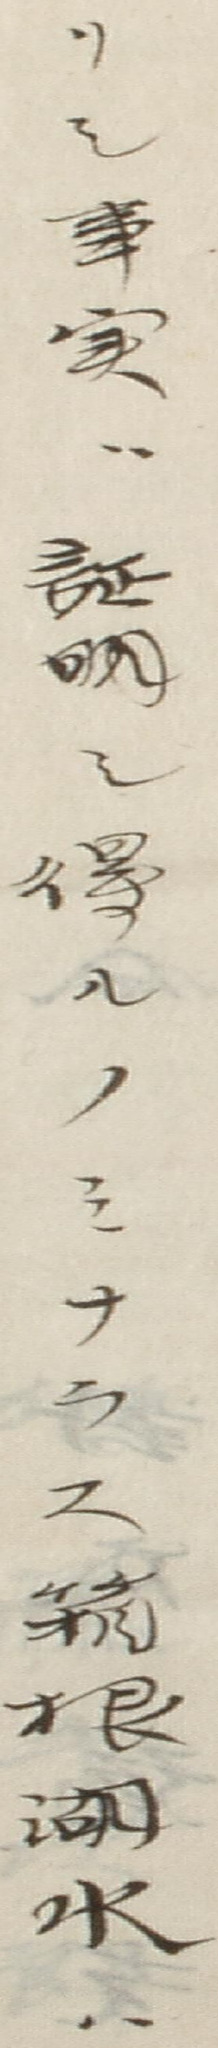リシ事実ハ証明シ得ルノミナラス箱根湖水ハ
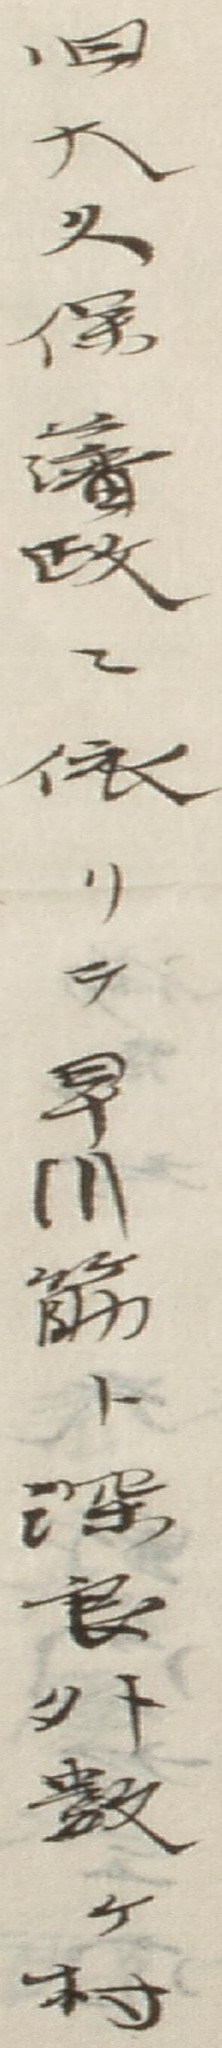旧大久保藩政ニ依リテ早川筋ト深良外数ケ村
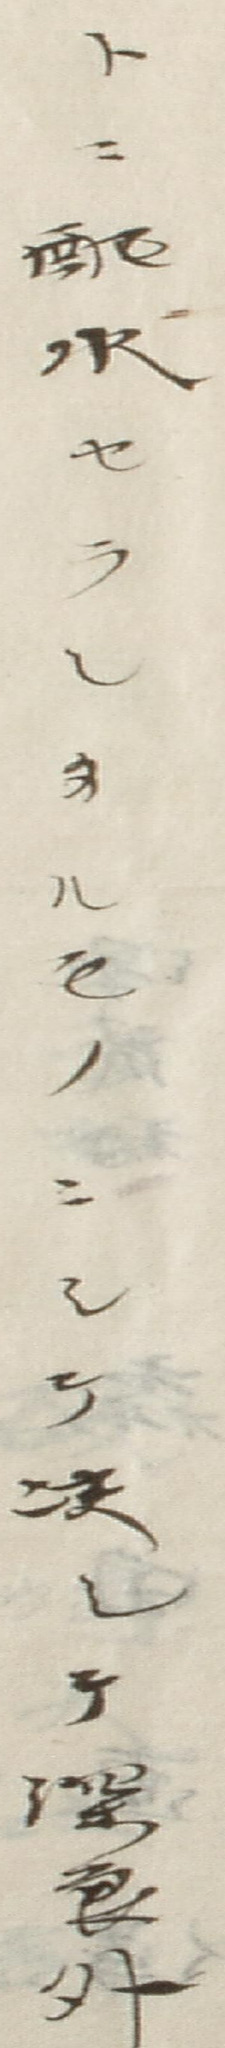トニ配水セラレタルモノニシテ決シテ深良外
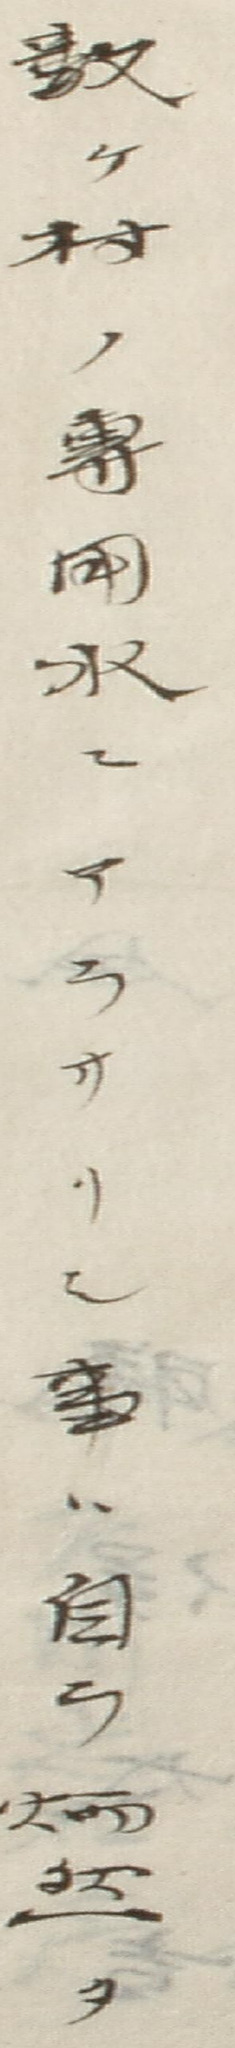数ケ村ノ専用水ニアラサリシ事ハ自ラ炳然タ
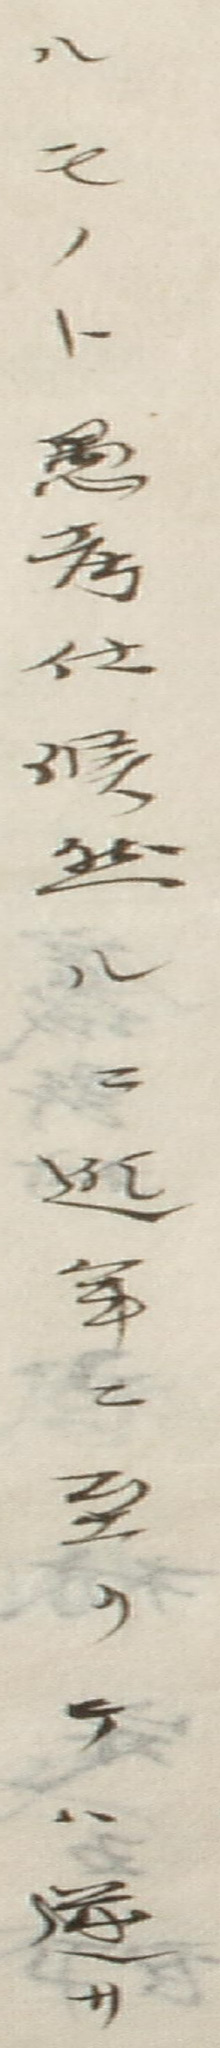ルモノト愚考仕候然ルニ近年ニ至リテハ逆サ
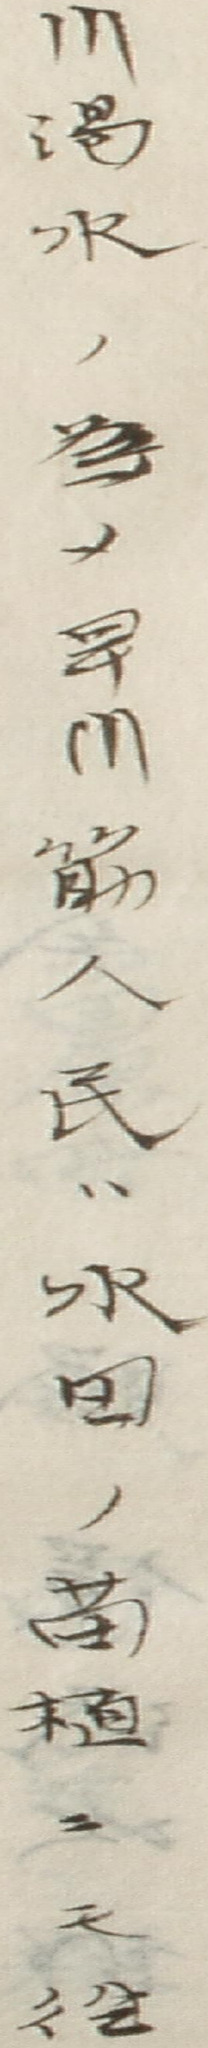川渇水ノ為メ早川筋人民ハ水田ノ苗植ニモ往
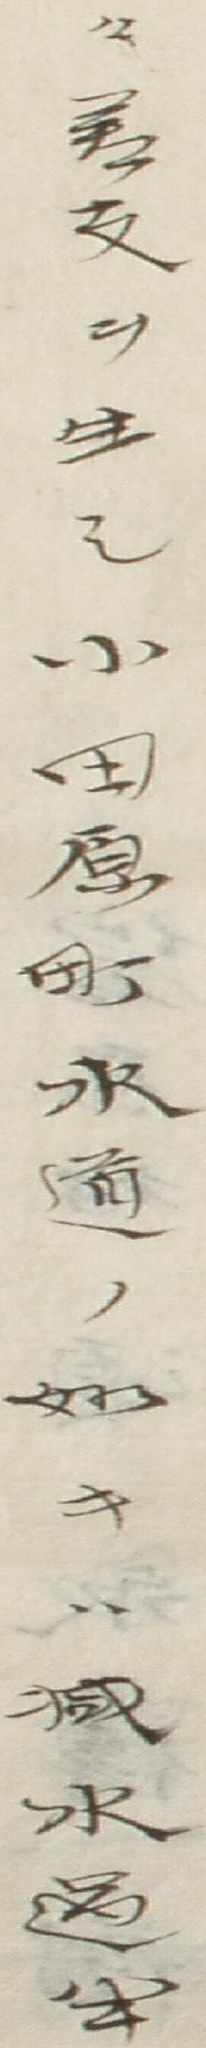々差支ヲ生シ小田原町水道ノ如キハ減水過半
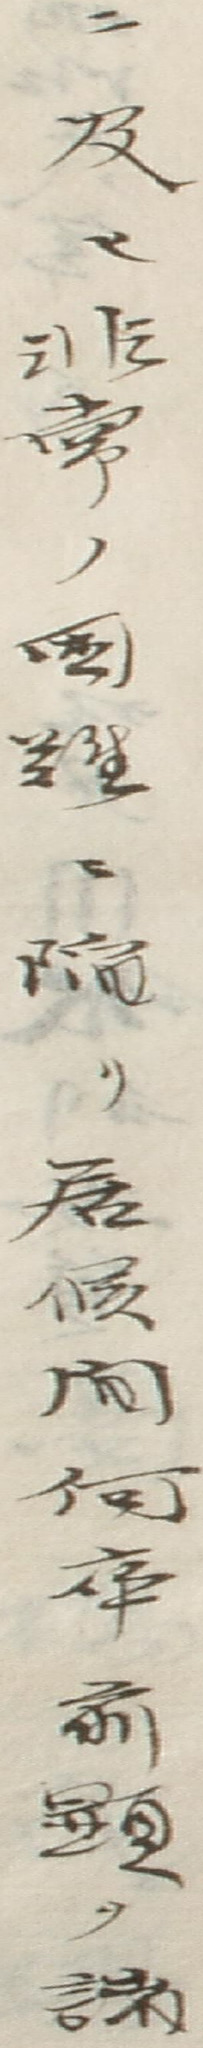ニ及ヒ非常ノ困難ニ陥リ居候間何卒前顕ノ諸
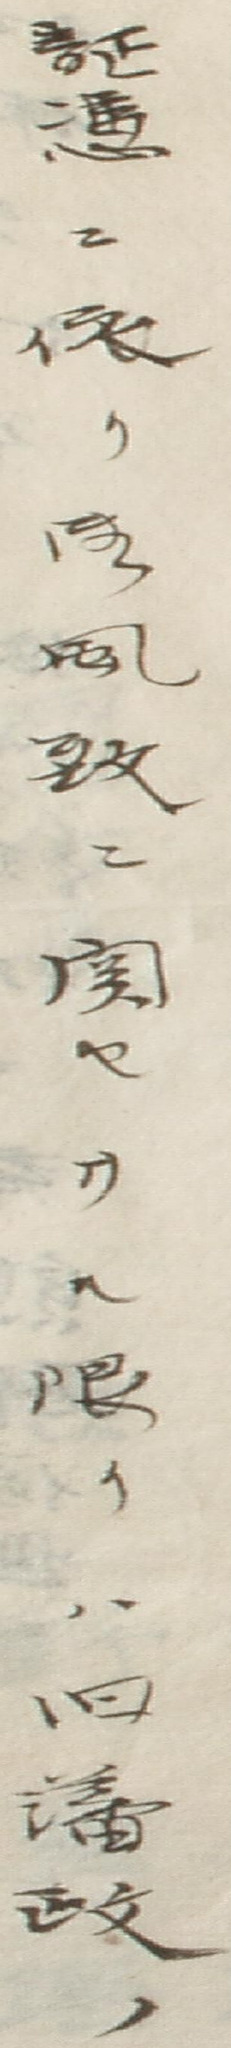証憑ニ依リ御風致ニ関セサル限リハ旧藩政ノ
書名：箱根湖水使用願　神奈川縣足柄下郡仙石原村外七ヶ町村
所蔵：東京大学地震研究所図書室 Earthquake Research Institute Library, The University of Tokyo, JAPAN
